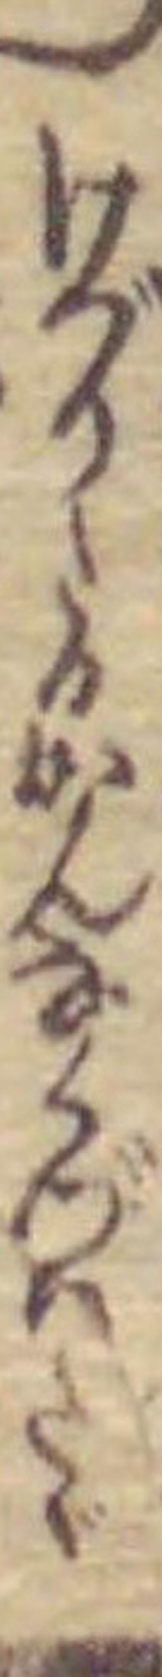けづりたるかんなくづはたゞ
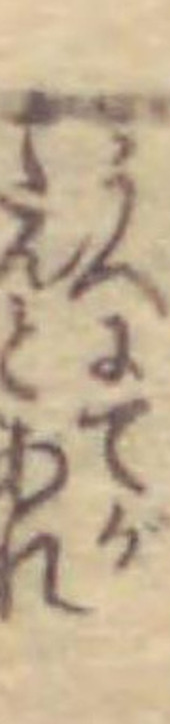うへにてが
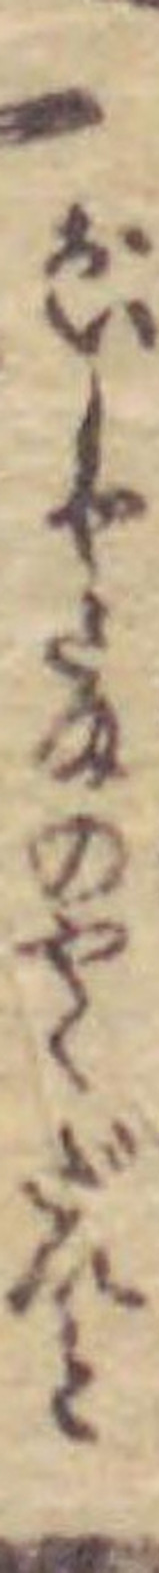おいしやさまのやくだいと
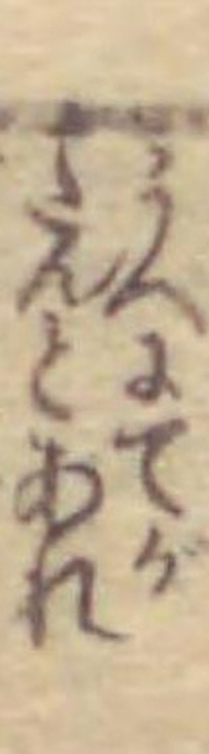たんとあれ
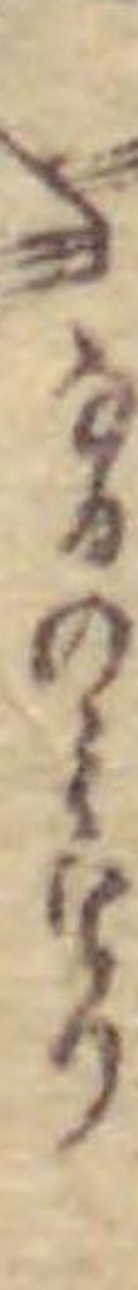なるのみなり
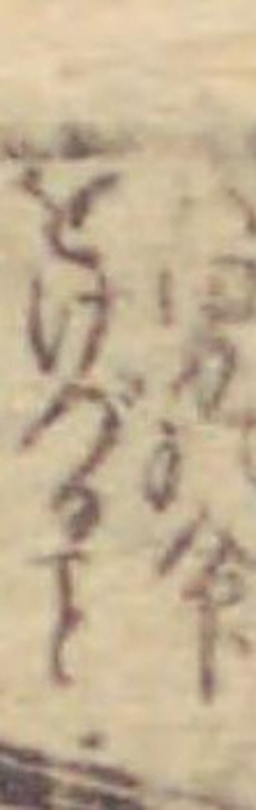をけづること
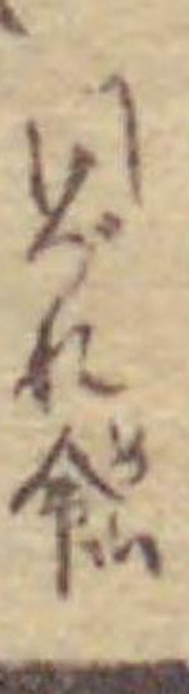〽いづれ命
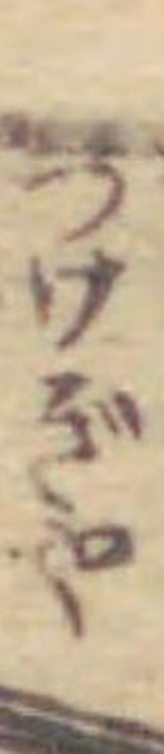つけぎや
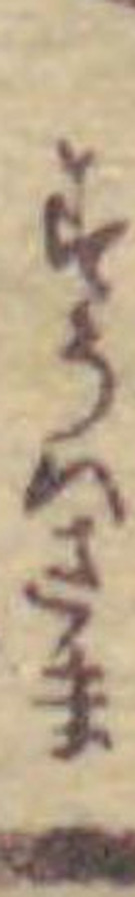すうはさま
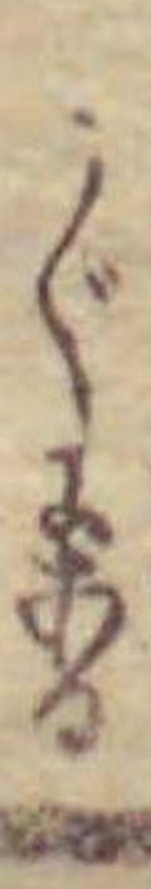〴〵にある
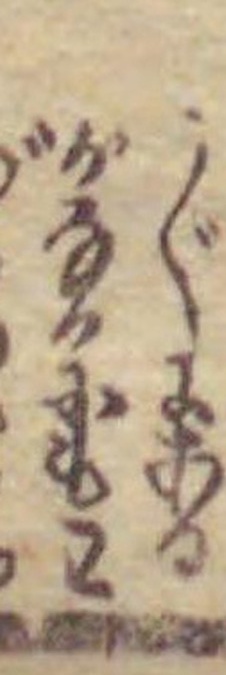がなかにもわ
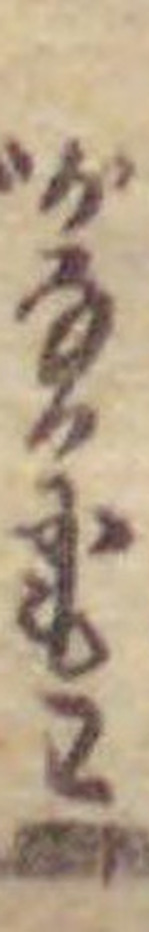がなかにもわ
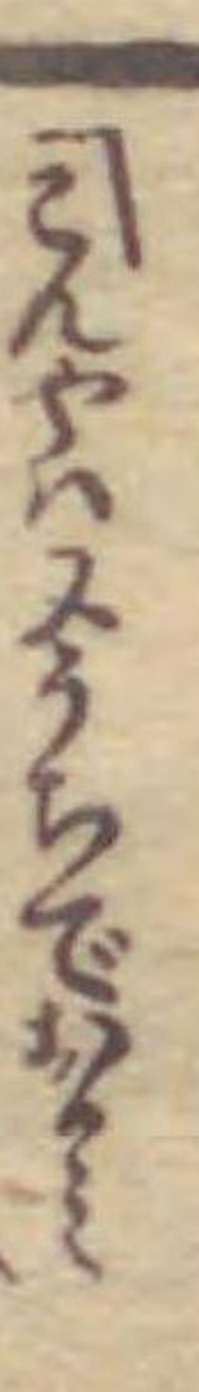〽こんやは又うちでおかみ
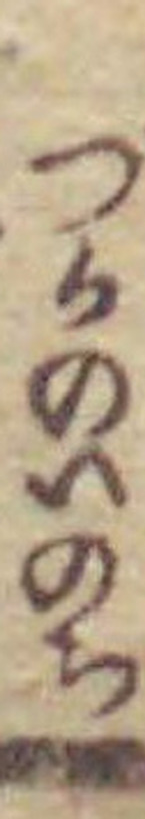づかのいのち
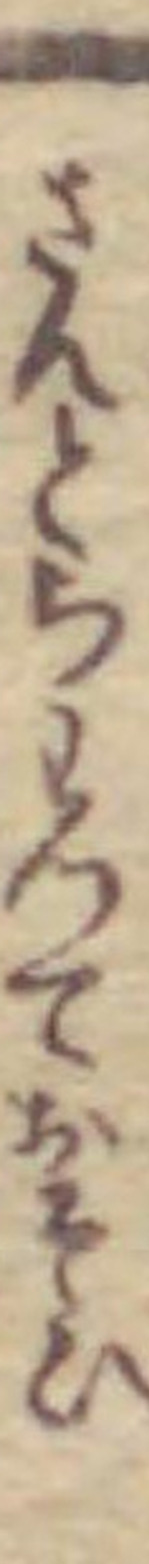さんとちわつておそひ
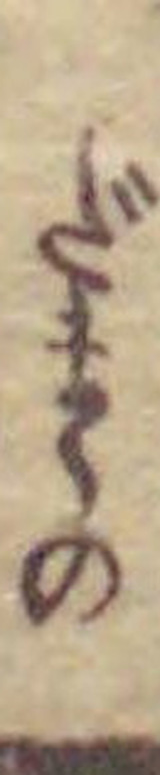だまゝの
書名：御誂染長寿小紋 : 3巻
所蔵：国立国会図書館 National Diet Library, JAPAN
